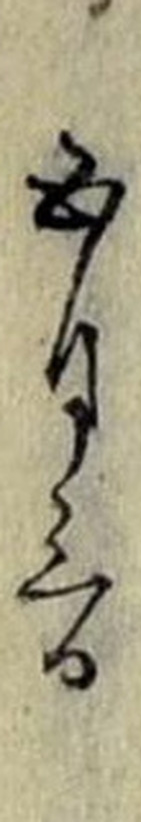五月三日
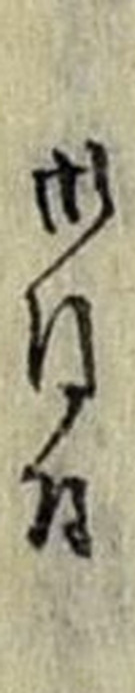御目付
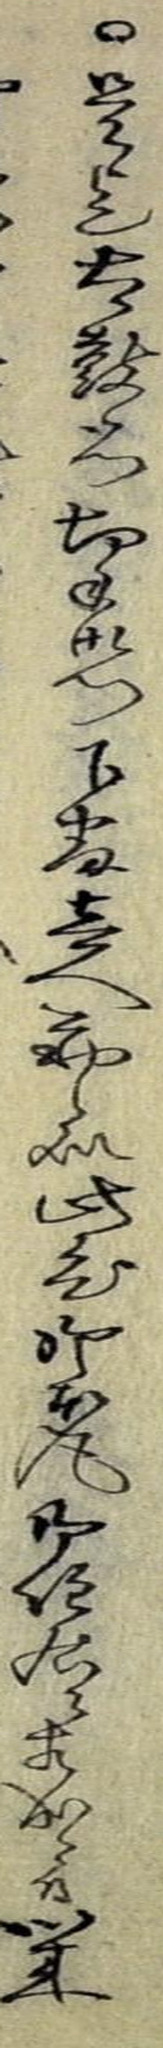○是迄太鼓御門切手御門下番壱人勤之処此度御本丸御住居ニ相成候ニ付以来
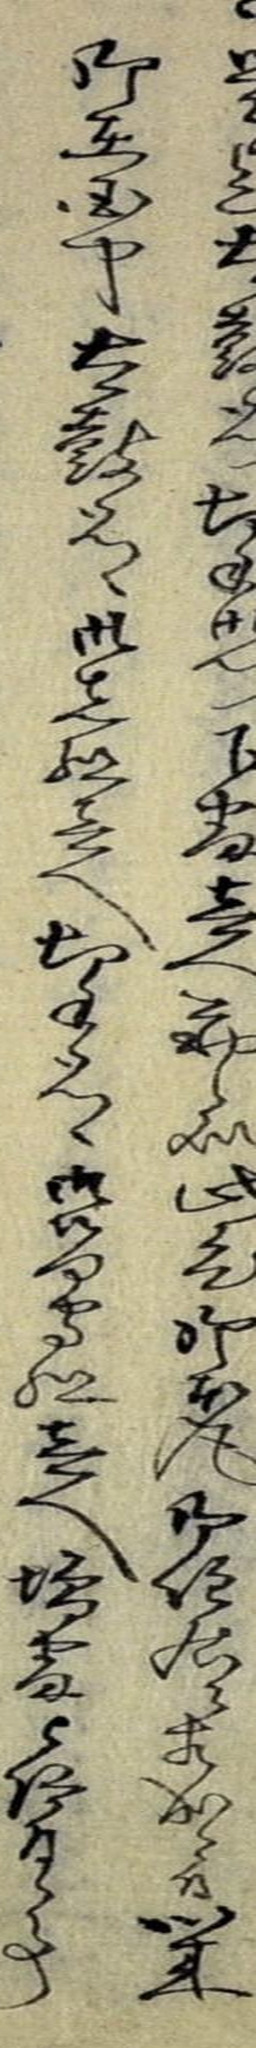御在国中太鼓御門へ御先組壱人切手御門へ御留守組壱人増番被仰付候事
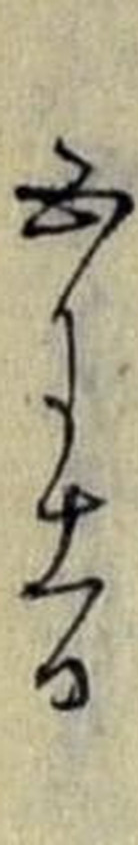五月十一日
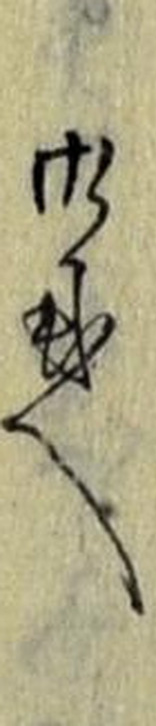御用人
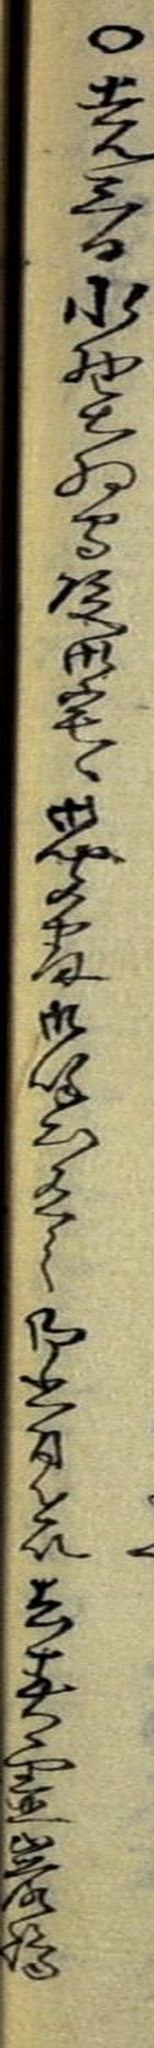○去ル三日水野出羽守殿御宅へ御聞番御呼出有之御書付を以去春霊巌島
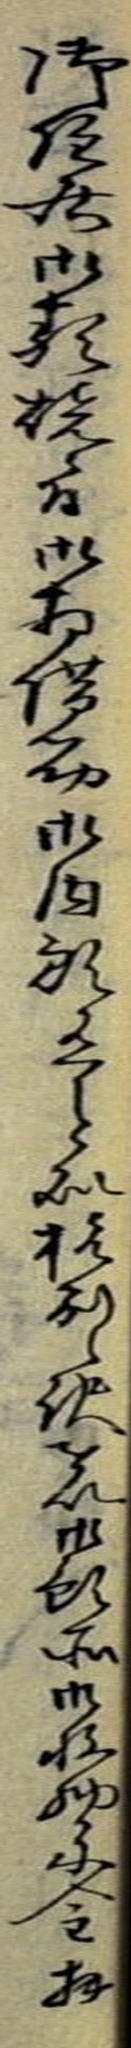御住居御類焼ニ付御拝借筋御内願有之候処格別之訳を以御預所御収納米金拝
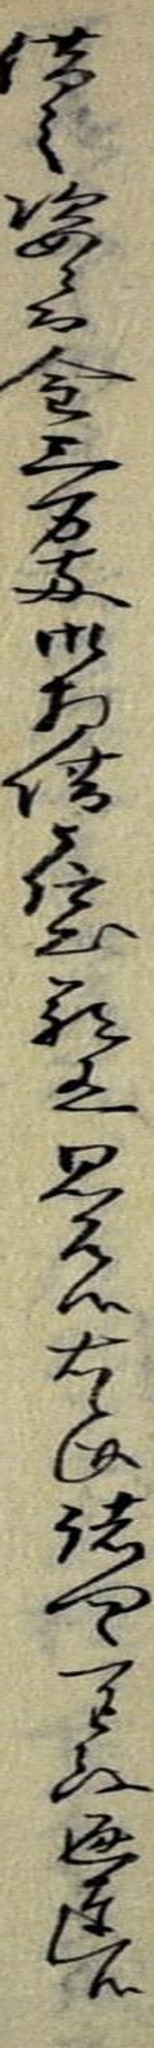借之姿ニ而金三万両御拝借被仰出難有思召候右之趣諸向へ可被致通達候
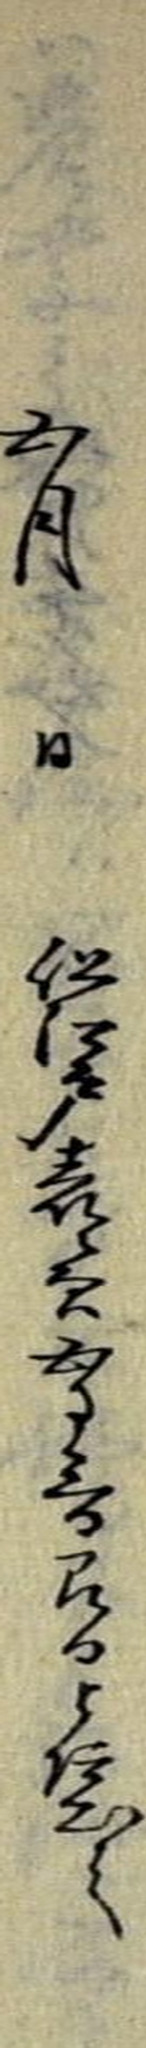五月日但江戸表ニ而ハ五月三日即日被仰出之
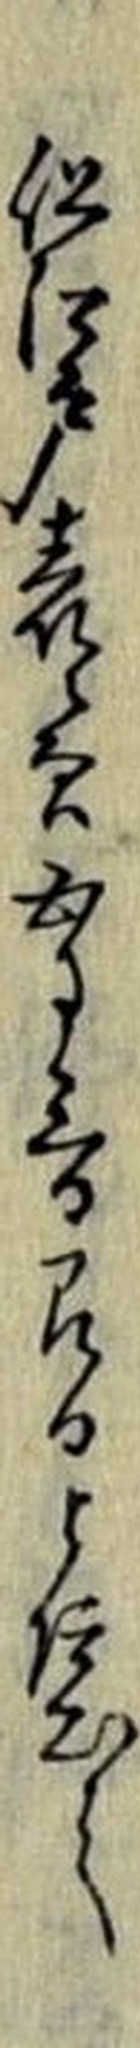五月日但江戸表ニ而ハ五月三日即日被仰出之
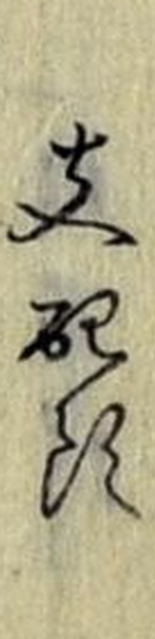支配頭
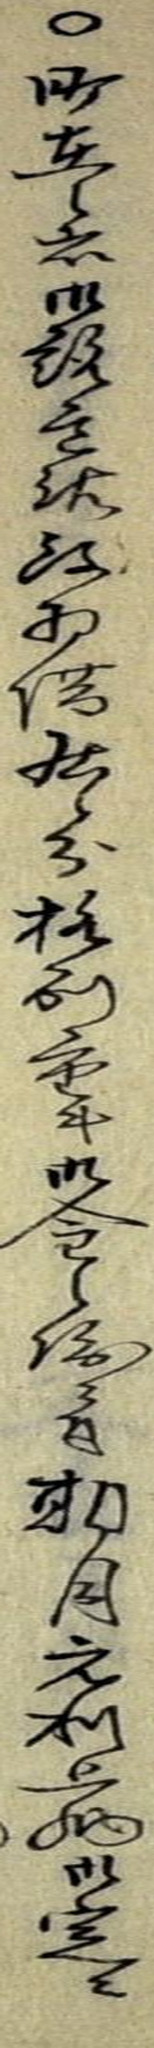○町在之者御趣意銀致拝借居候分格別重キ御金之儀ニ付期月元利上納御定ニ
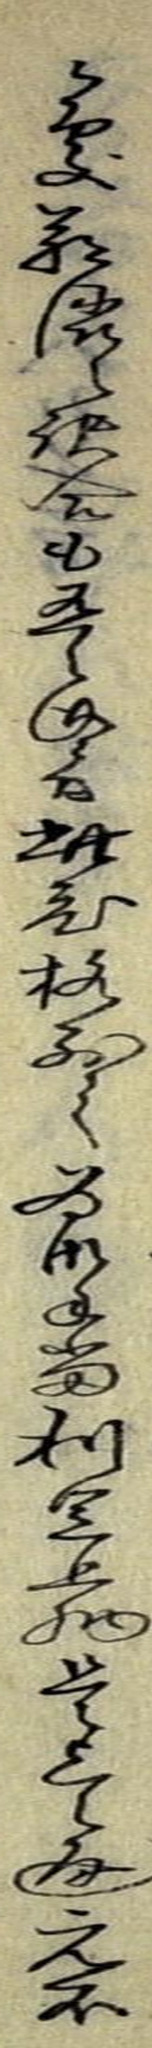候処難渋之訳合も有之趣ニ付此度格別之為御手当利宜上納是迄之通元不
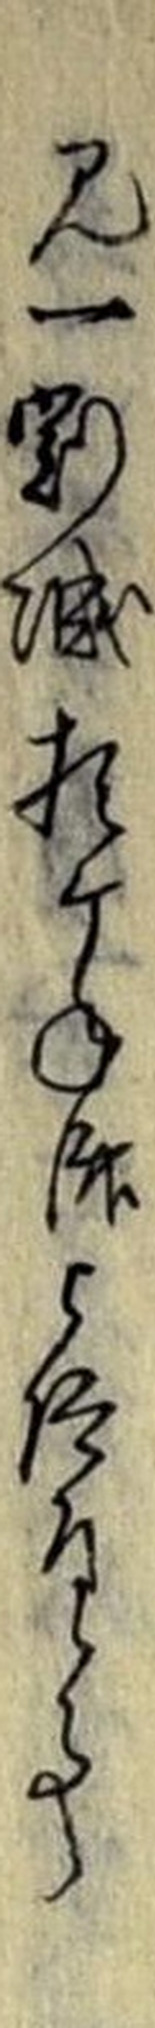見一割減拾ケ年済被仰付候事
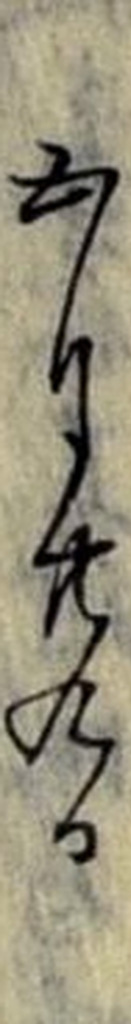五月廿九日
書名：命令之部 五
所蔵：福井県文書館 Fukui Prefectural Archives
